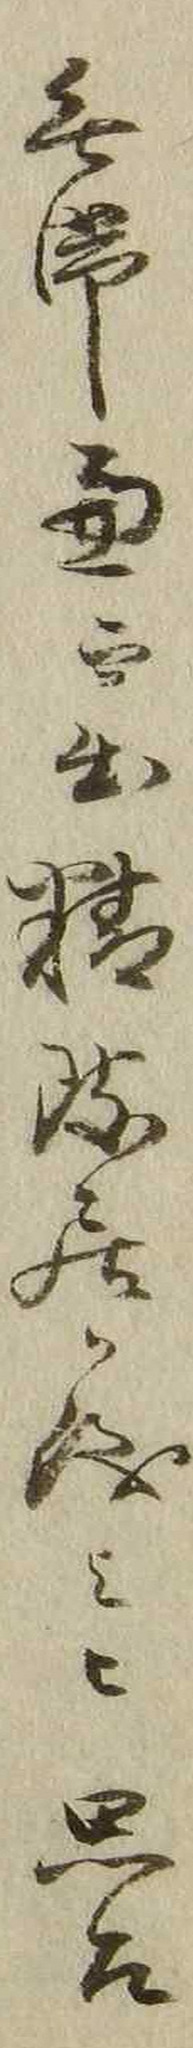無滞之兼而出精致居候儀与被思召
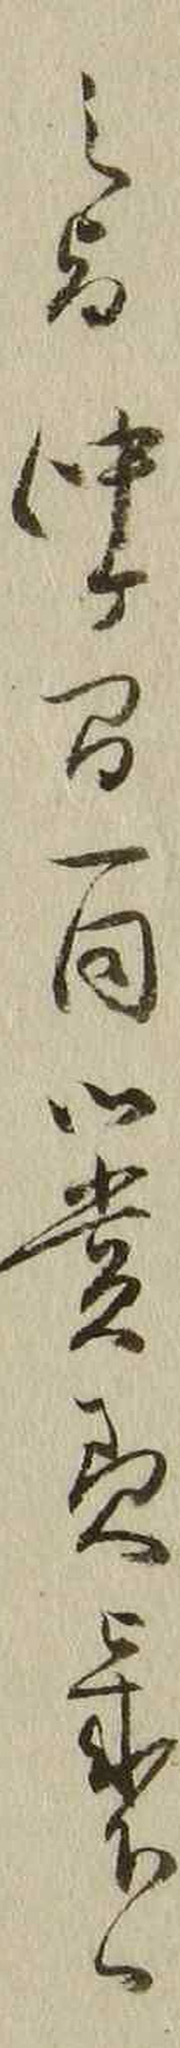之旨仲ヶ間一同御賞美被成下候
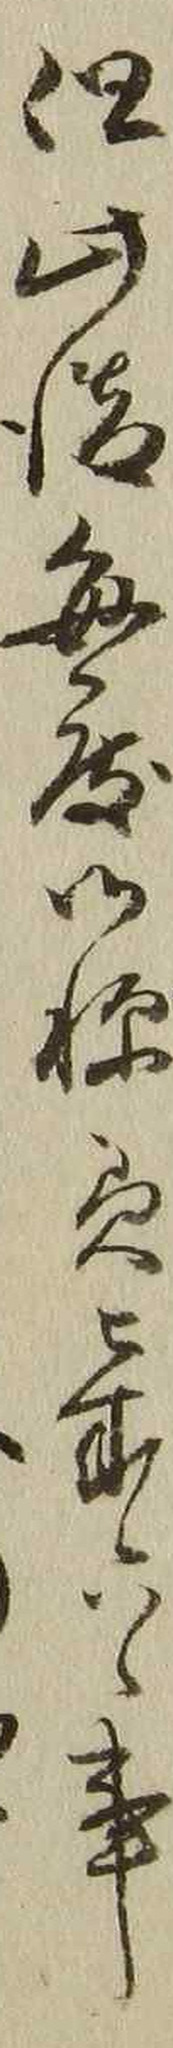但此後毎度御称美被成下候事
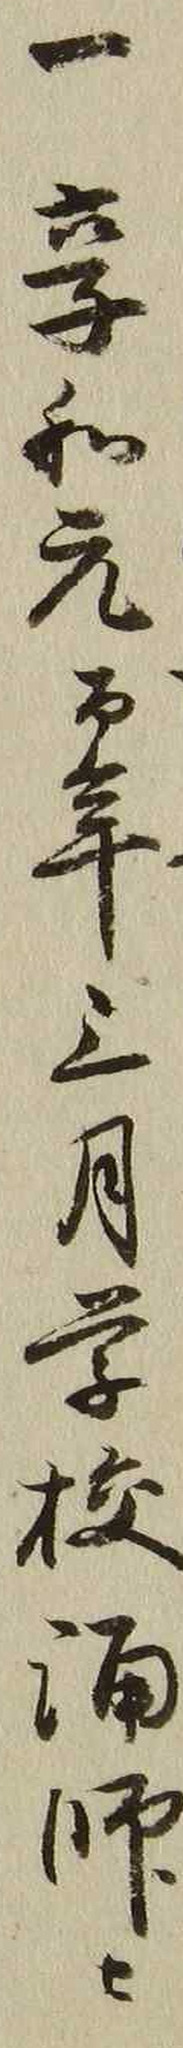一享和元酉年三月学校誦師被
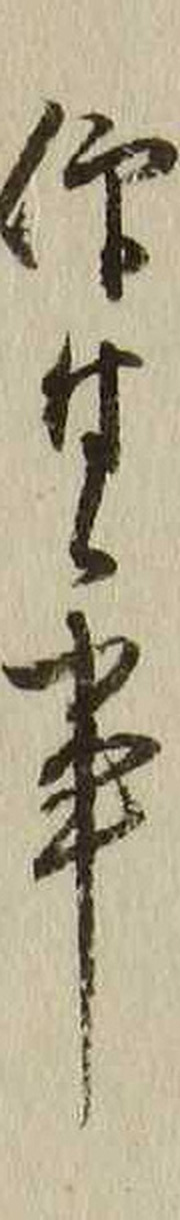仰付候事
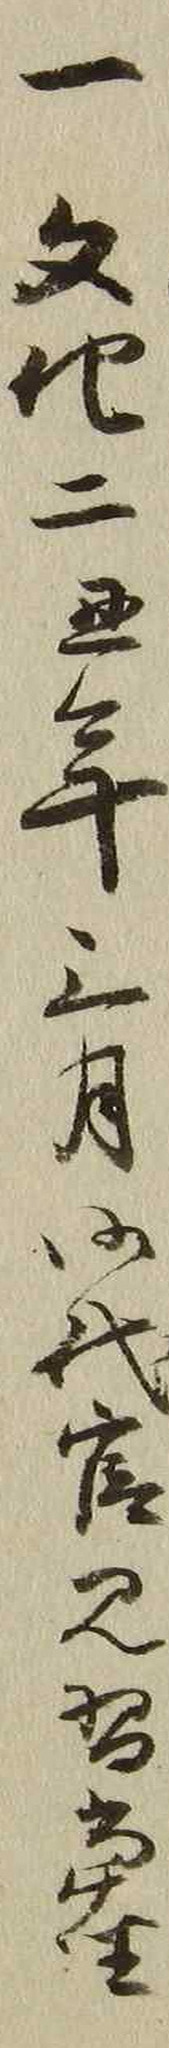一文化二丑年三月御代官見習当座
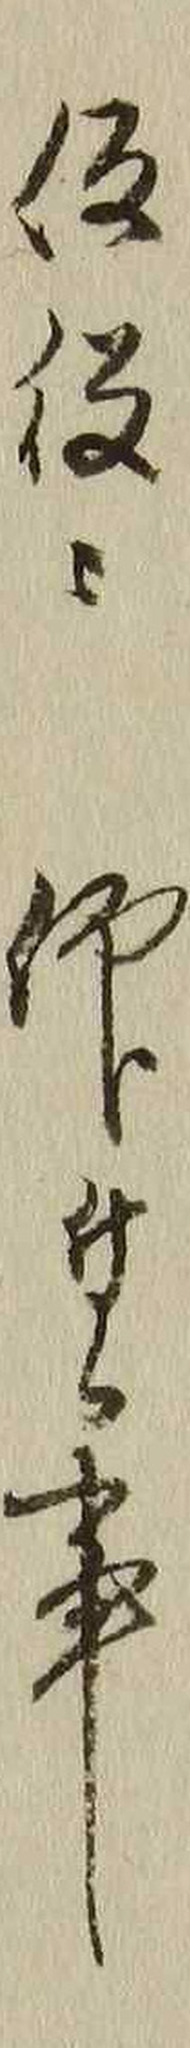仮役被仰付候事
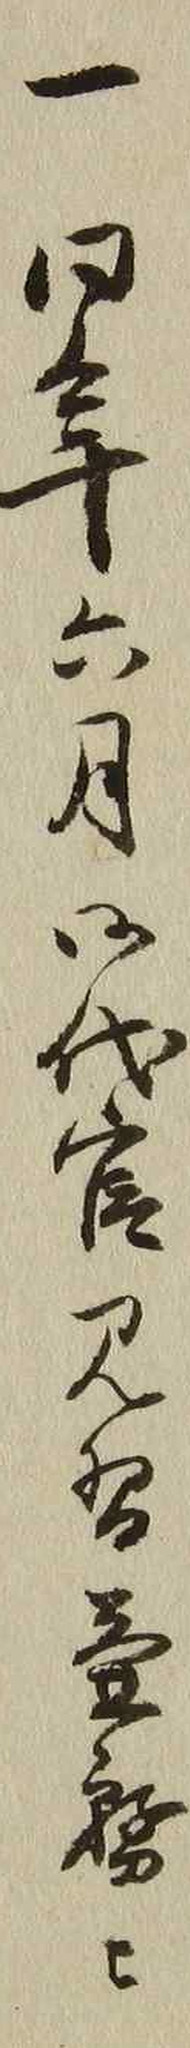一同年六月御代官見習兼務被
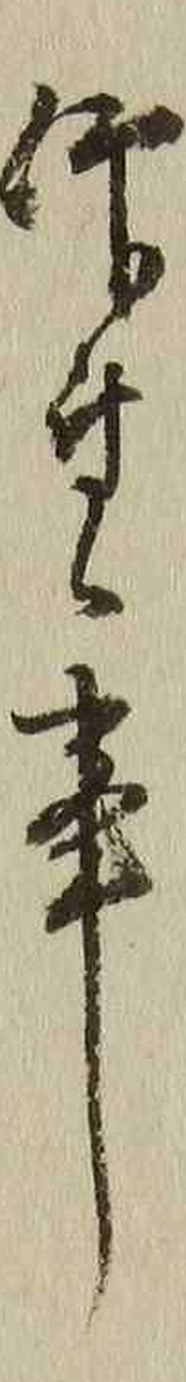仰付候事
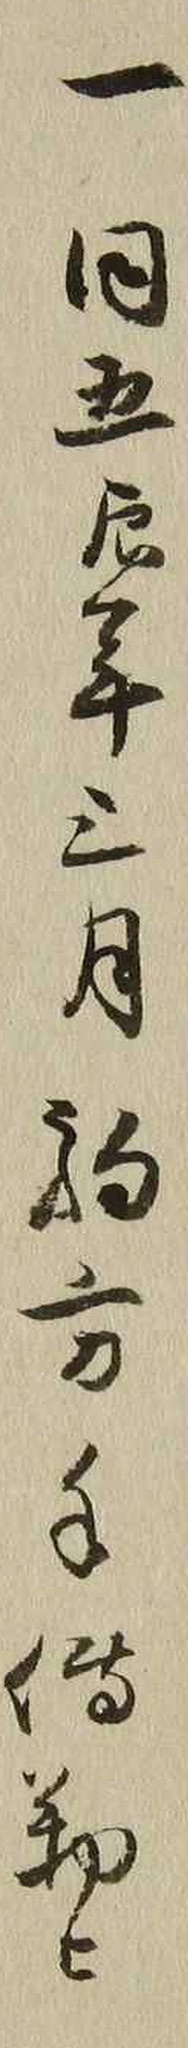一同五辰年三月駒方手伝勤被
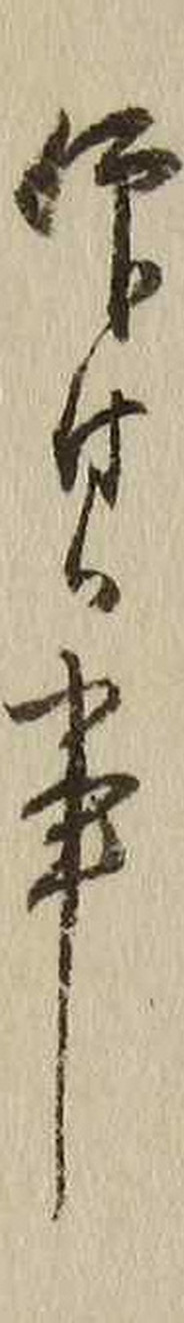仰付候事
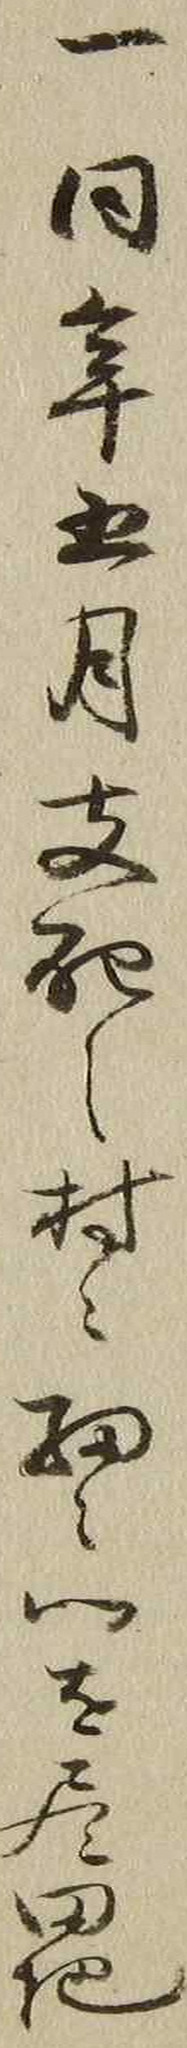一同年五月支配之村々細々心を尽田地
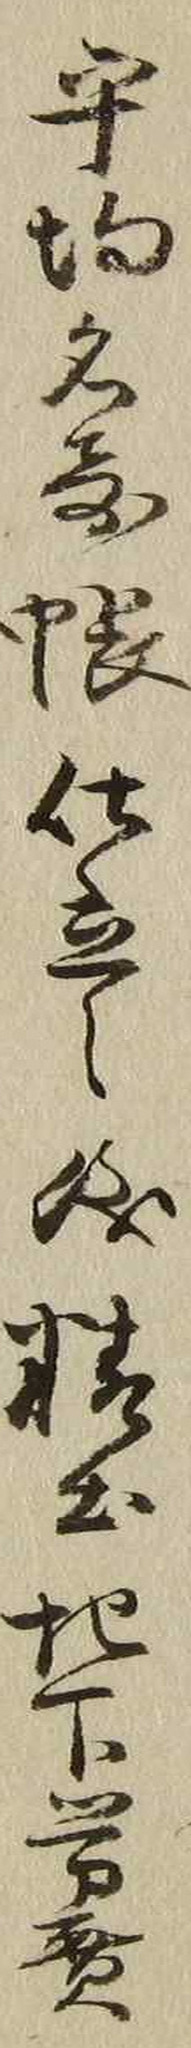平均名寄帳仕立之儀精出地下労費
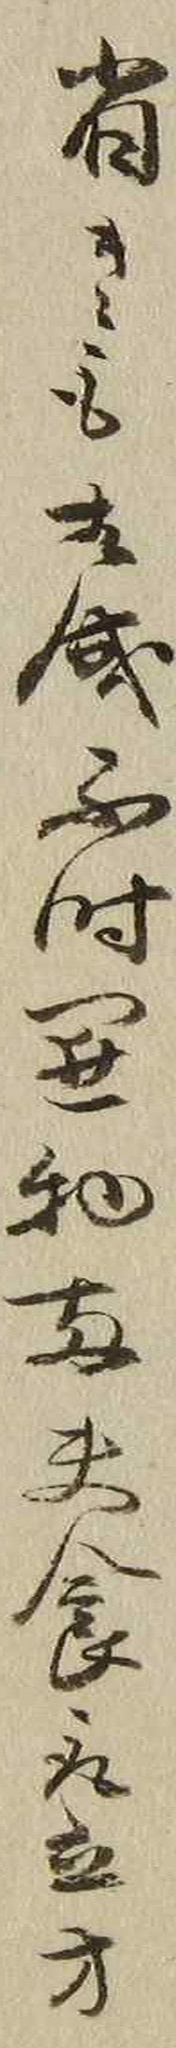省きニも相成不時宜物両夫食取立方
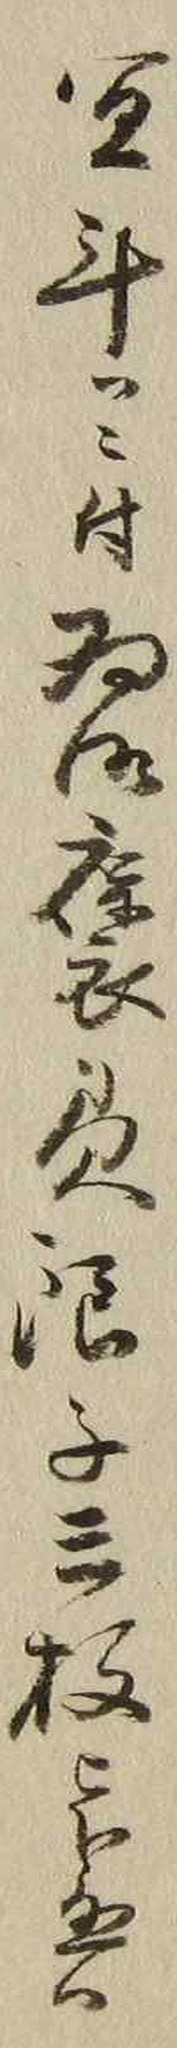宜計候ニ付為御褒美銀子三枚被下置候
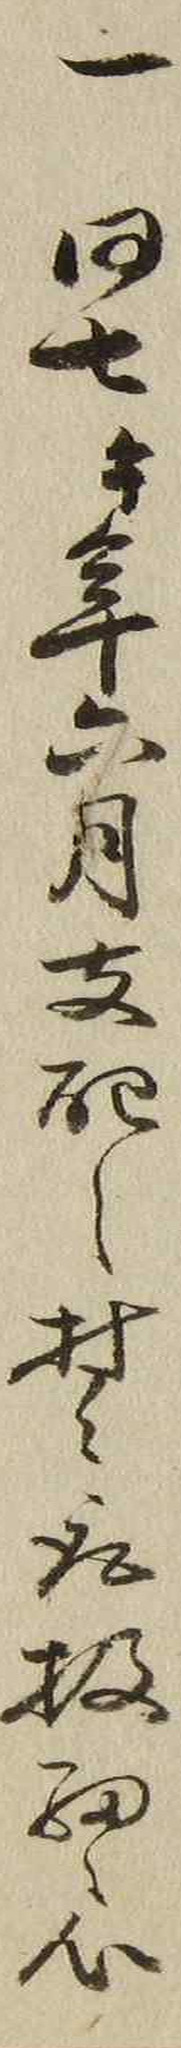一同七午年六月支配之村々取扱細々心
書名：諸士系譜　巻之236　ふ之部4
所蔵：会津若松市立会津図書館
